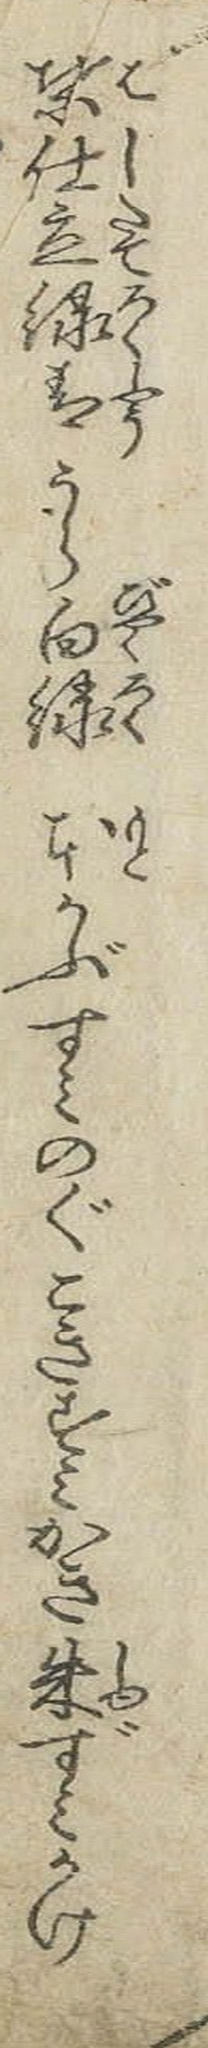葉仕立緑青うら白緑本かぶすみのぐこきすみかき朱ずみかけ

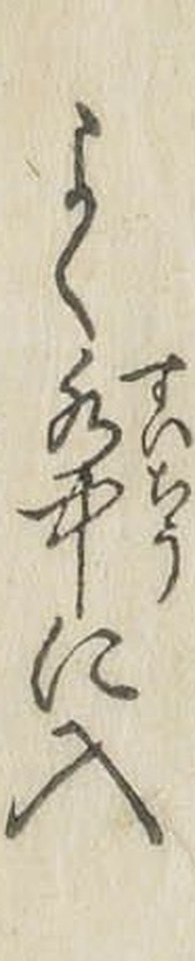よく水中に入
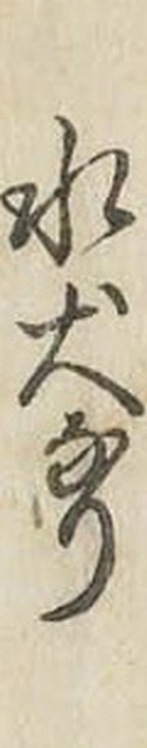水犬なり

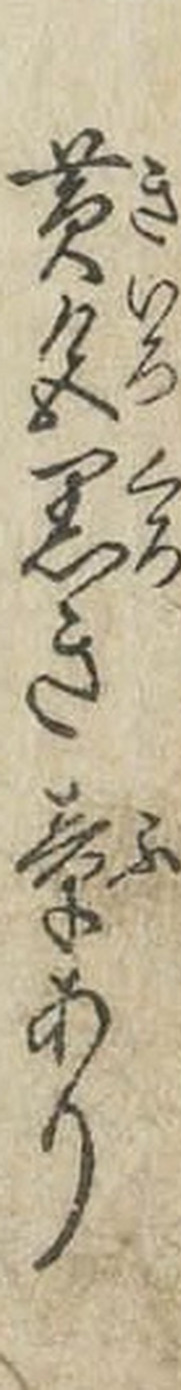黄色黒き章あり
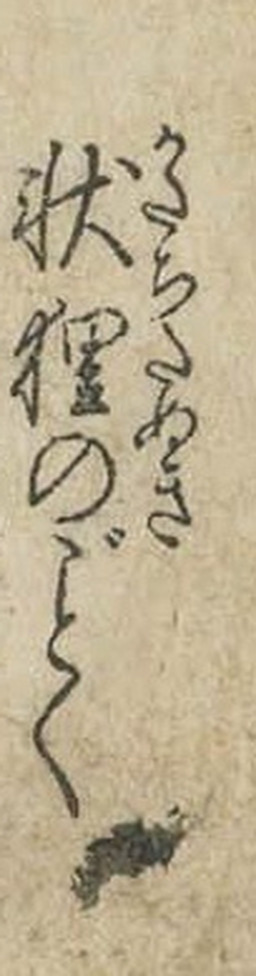状狸のごとく
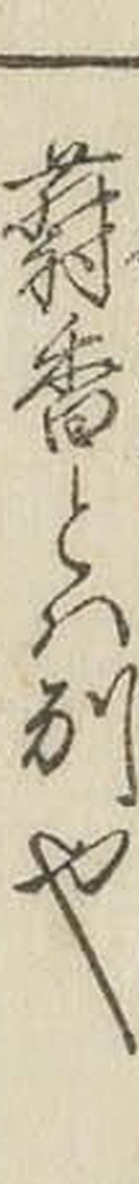麝香とは別也
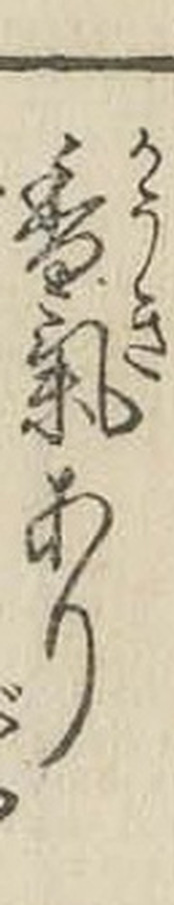香気あり
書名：絵本写宝袋 9巻 9之巻上
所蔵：東京学芸大学教育コンテンツアーカイブ
